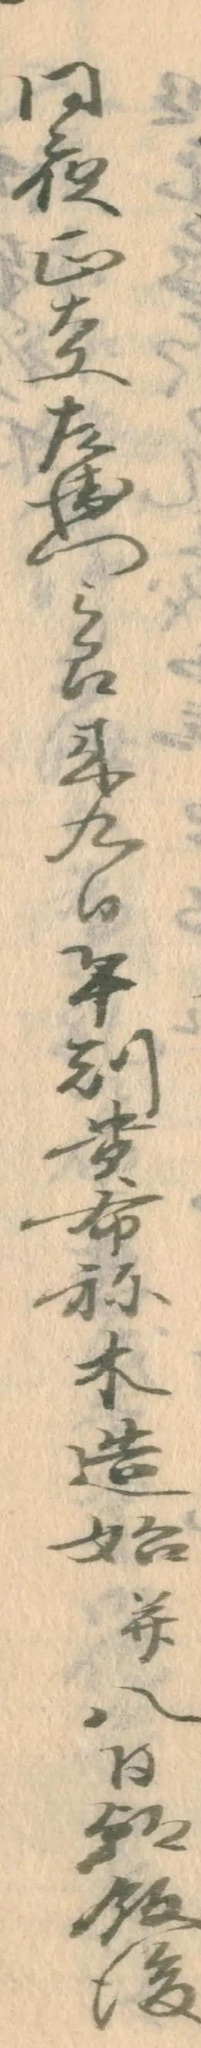一同夜正大工左衛門被召来九日午刻貴布祢木造始并八日朝飯後
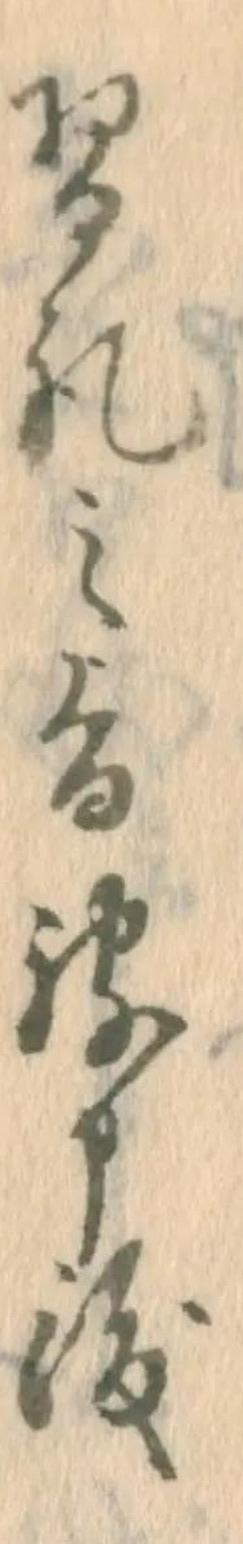習礼之旨被申渡
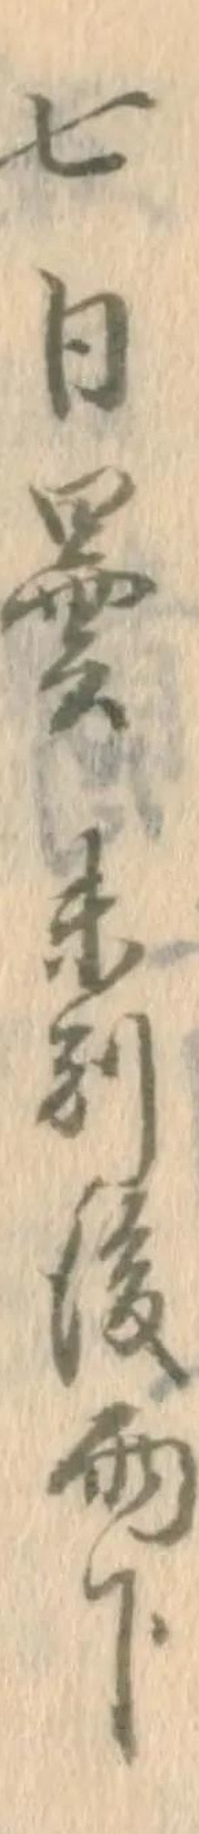七日曇未刻後雨下
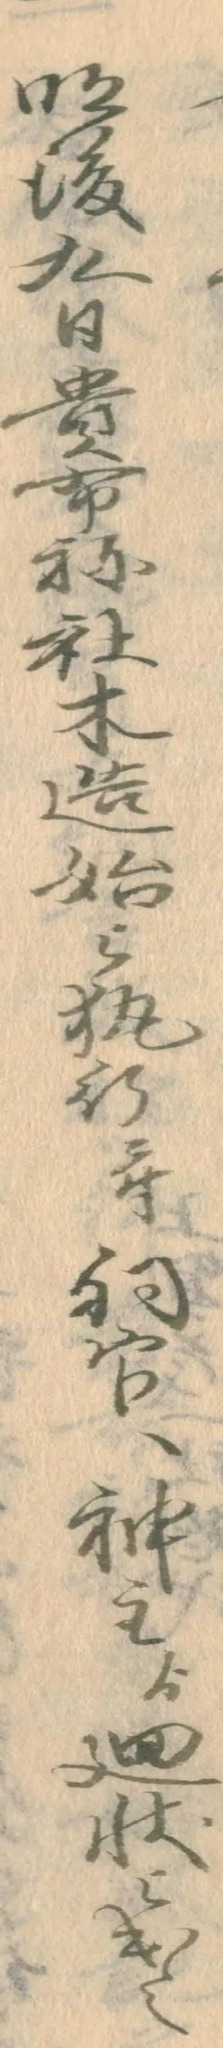一明後九日貴布祢社木造始被執行ニ付祠官へ神主ゟ廻状被出之
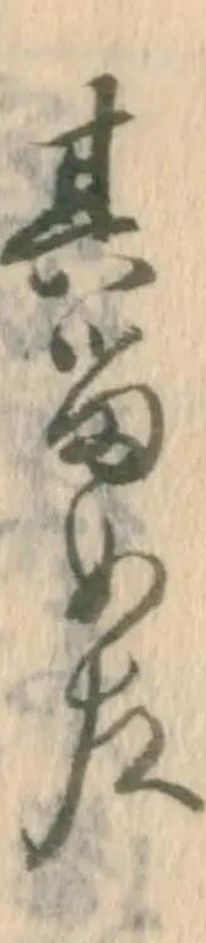其留如左
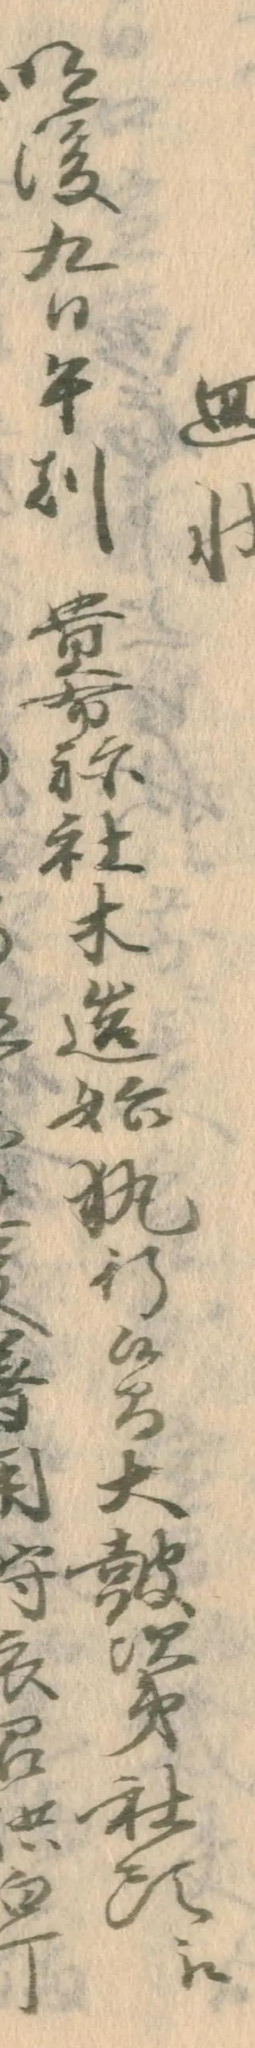明後九日午刻貴布祢社木造始執行候間大鼓次第社頭江
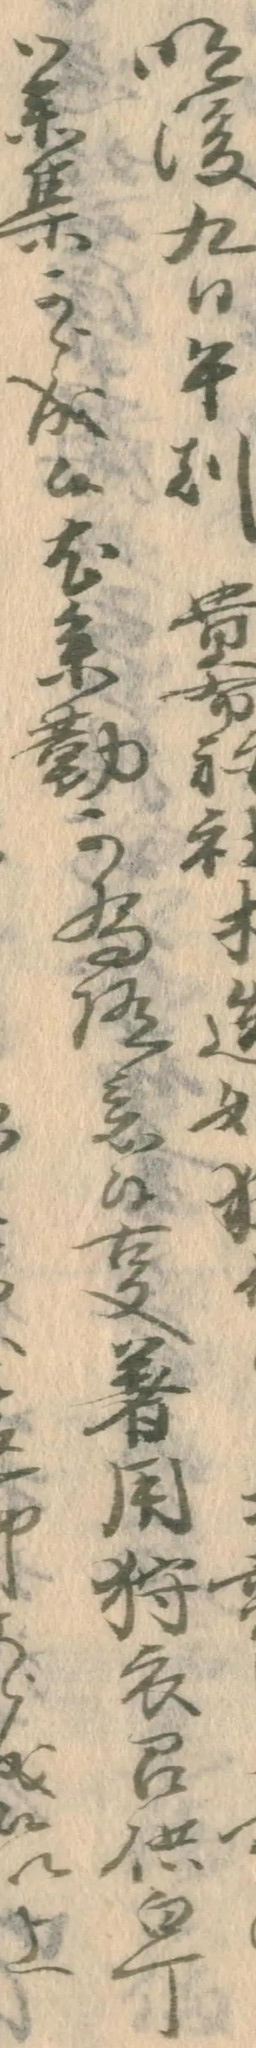御参集可被成候尤参勤可為随意候事着用狩衣召供白丁
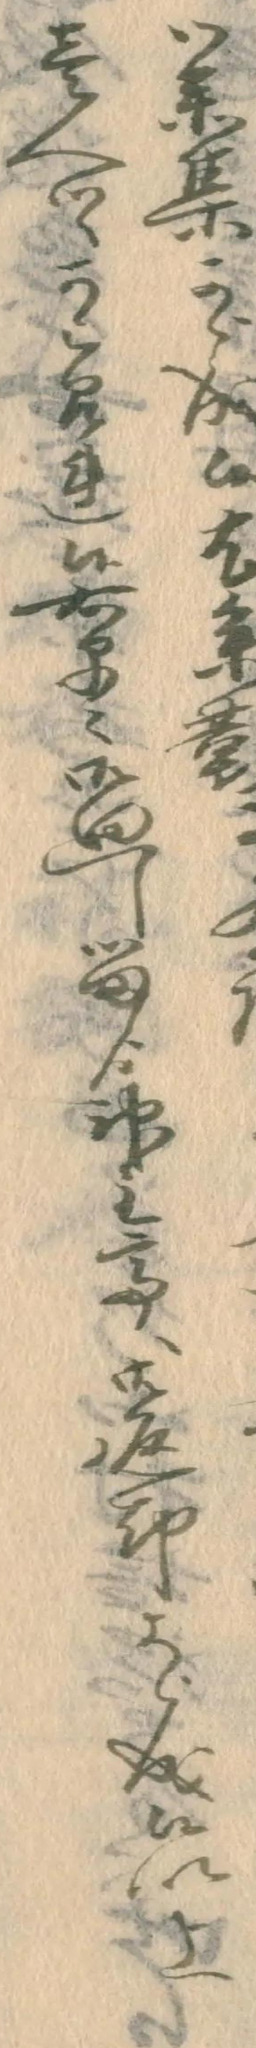壱人ツヽ可被召連候右早々御廻し留ゟ神主亭へ御返却被成候以上
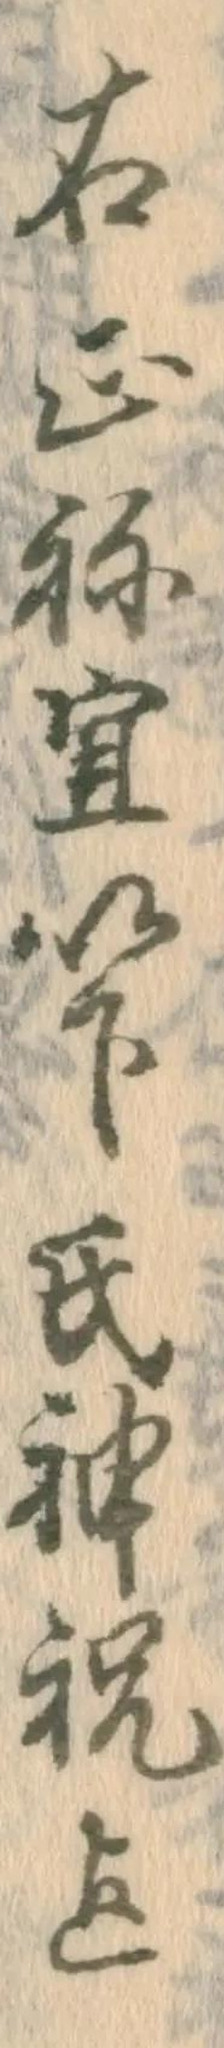右正祢宜以下氏神祝迄
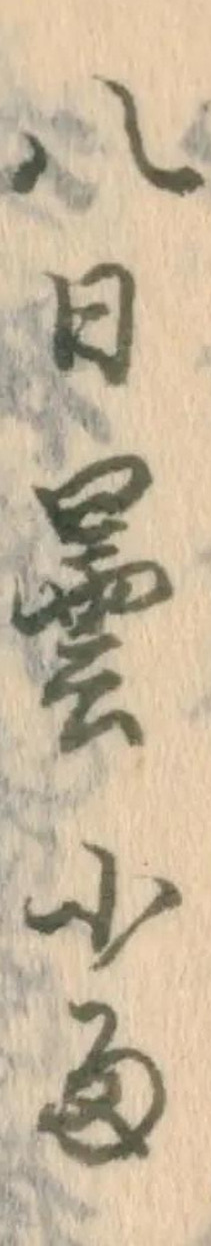八日曇小雨
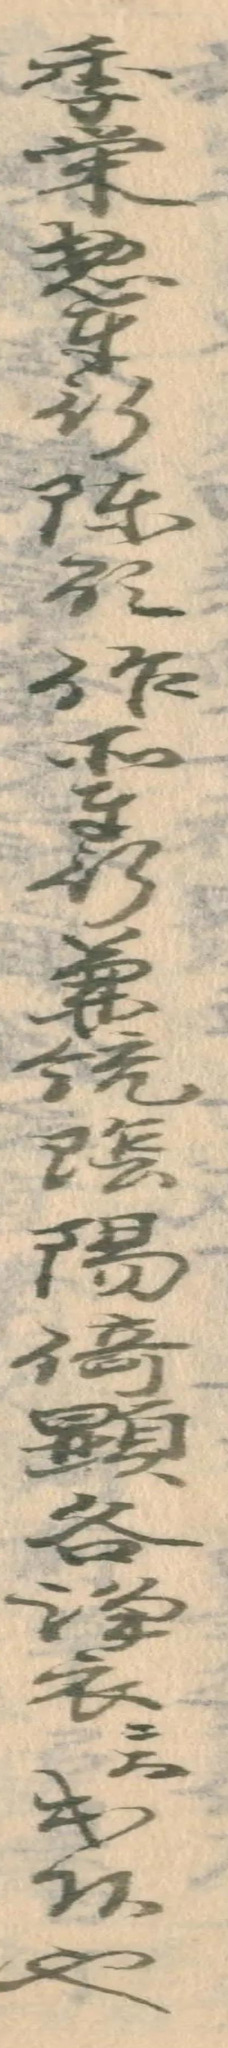季栄惣奉行陣顕作所奉行兼統陰陽倚顕各浄衣ニ而出頭也
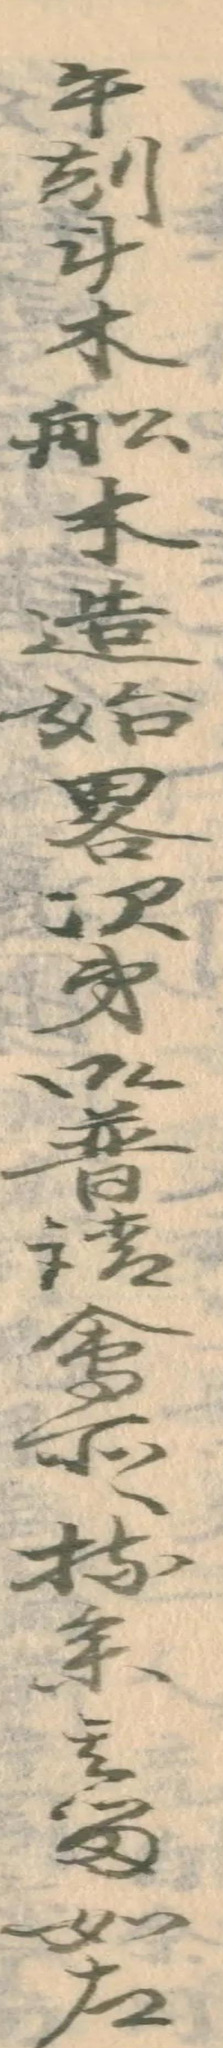一午刻計木船木造始略次第御普請会所へ持参其留如左
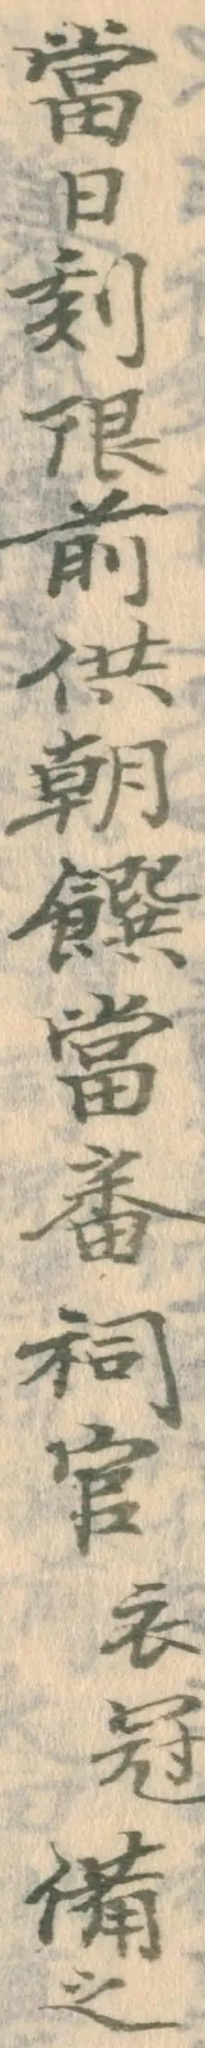当日刻限前供朝饌当番祠官衣冠備之
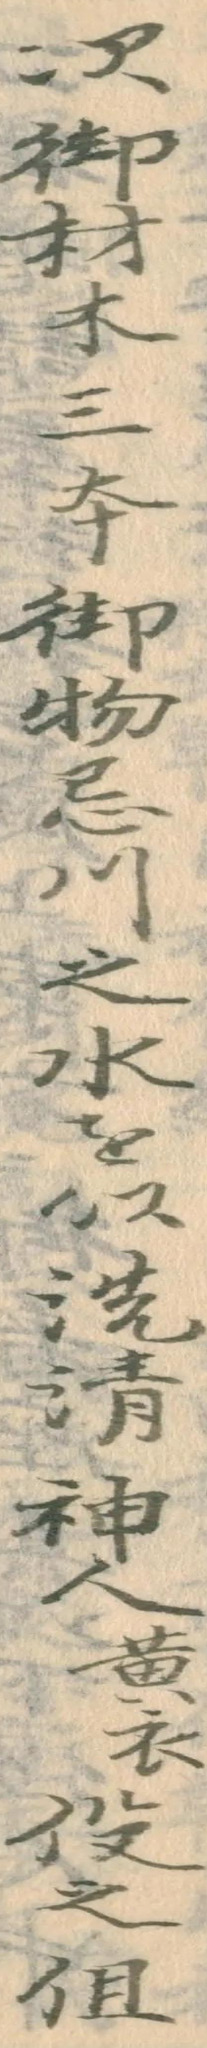次御材木三本御物忌川之水を以洗清神人黄衣役之但
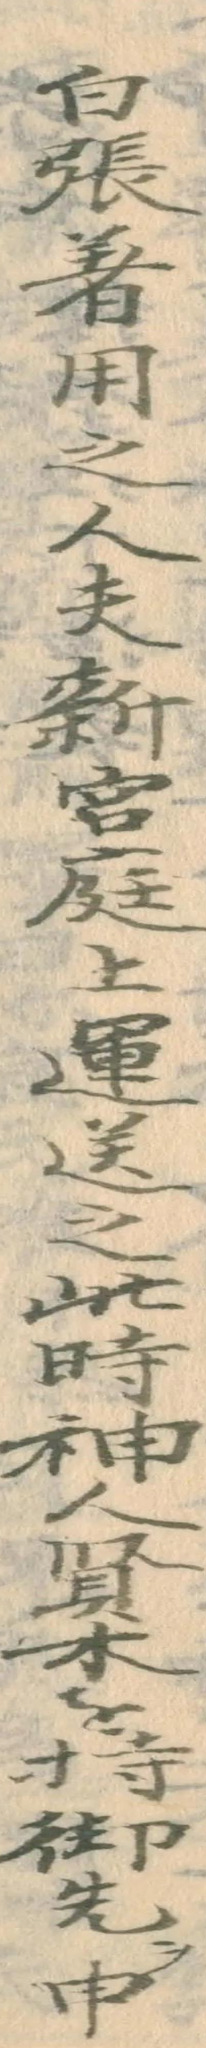白張着用之人夫新宮庭上運送之此時神人賢木を持御先ヲ申
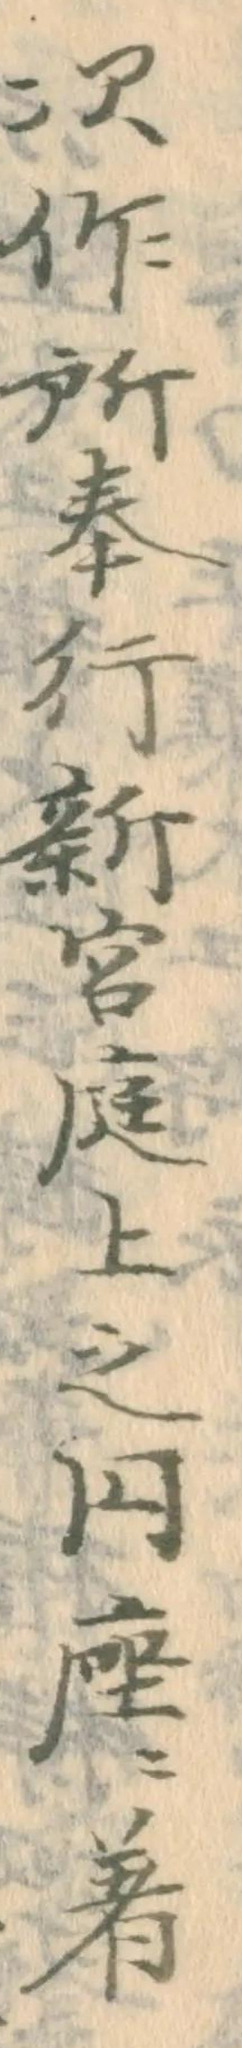次作所奉行新宮庭上之円座ニ着
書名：賀茂社記録. 第17冊
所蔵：国立国会図書館 National Diet Library, JAPAN
